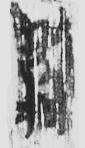臨
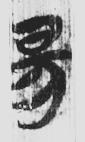昜（陽）
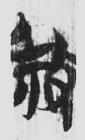杀
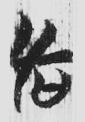左
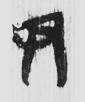尹
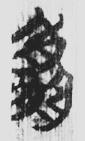○（宛）
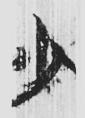少
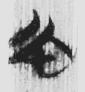帀（师）
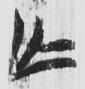亡（无）
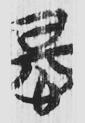○（忌）
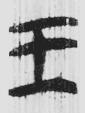王
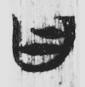曰
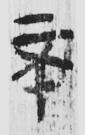不
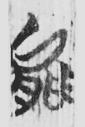能
